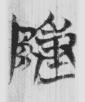陳
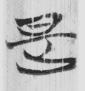是
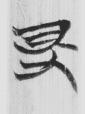𠭁
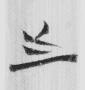之
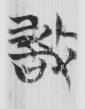敢
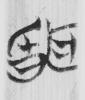䎽
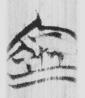齊
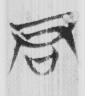君
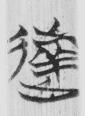{辶止㚔}
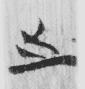之
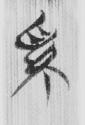奚
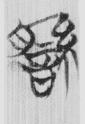䌛
